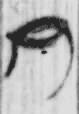尹
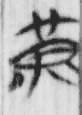黃
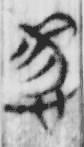惕
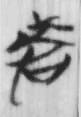差
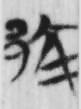○（蔡）
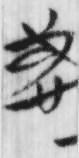惑
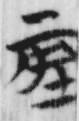坪
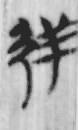○（射）
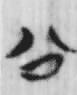公
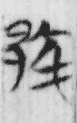○（蔡）
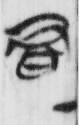冒
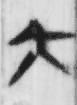大
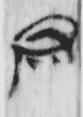尹
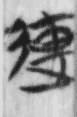連
